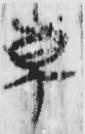東
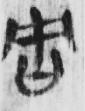周
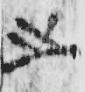之
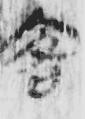客
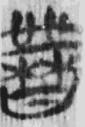○（許）
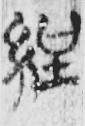○（盈）
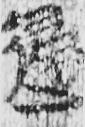歸
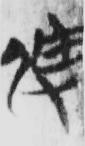{尸拃}（胙）
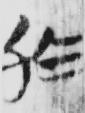於
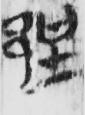郢
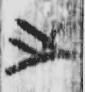之
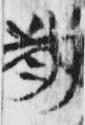歲（歲）
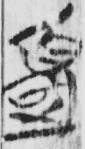○（夏）
